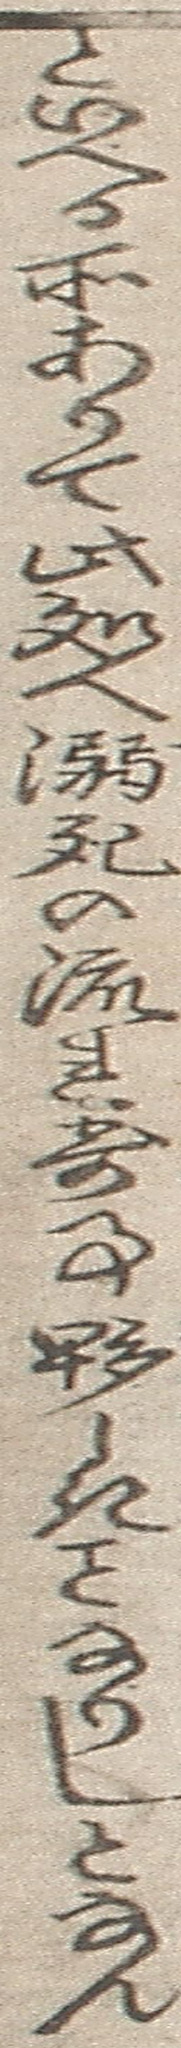といへる所ありて此処へ溺死の流れ寄事夥しきことなりしとなん

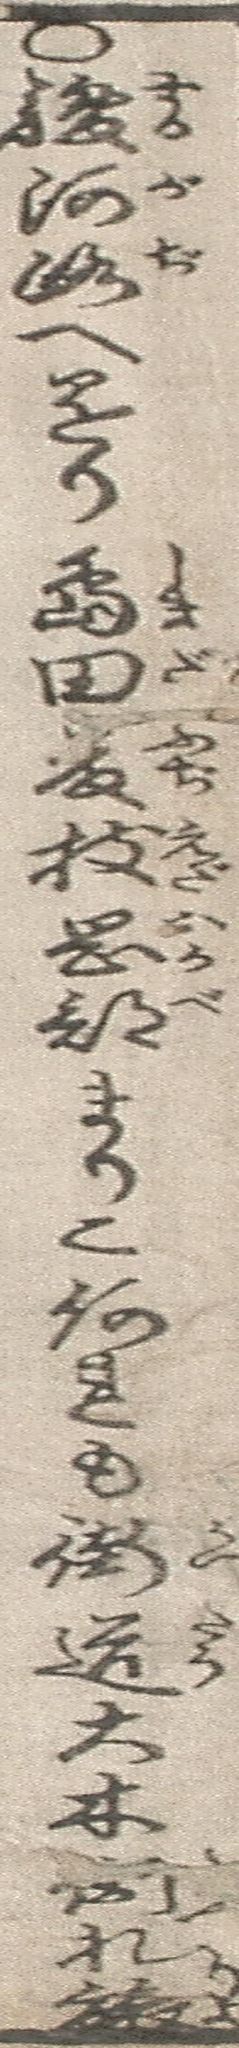◯駿河路へ懸り嶋田藤枝岡部まりこ何れも街道大木倒れ旅
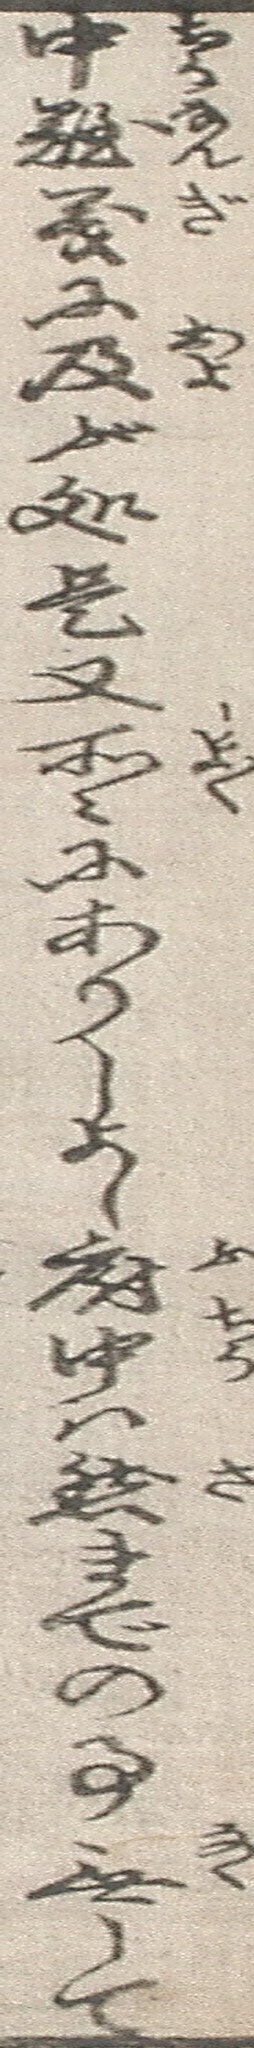中難儀に及ぶ処是又所々にありしよし府中ハ然までの事無して
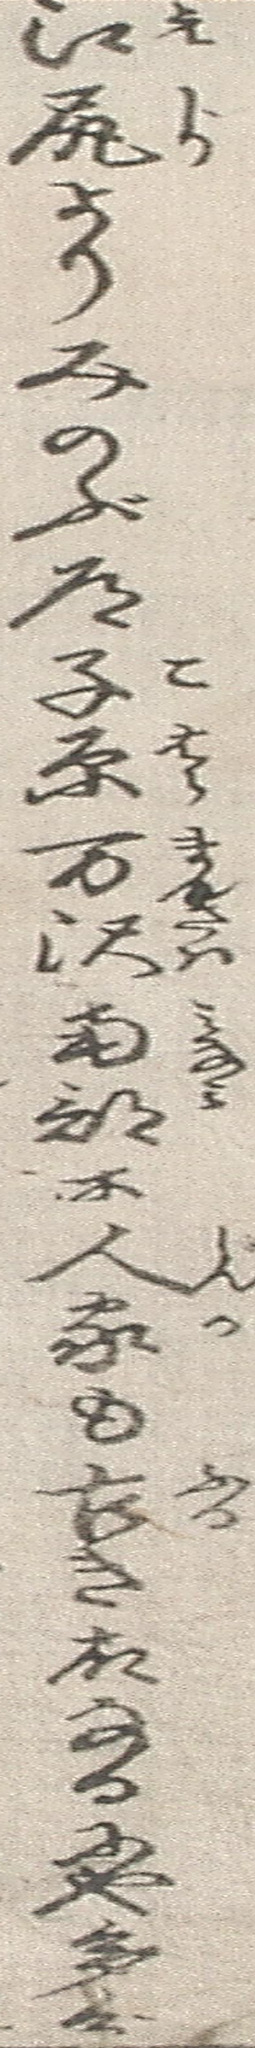江尻よりみのぶ道子原万沢南部等人家も古き故なるにや多分
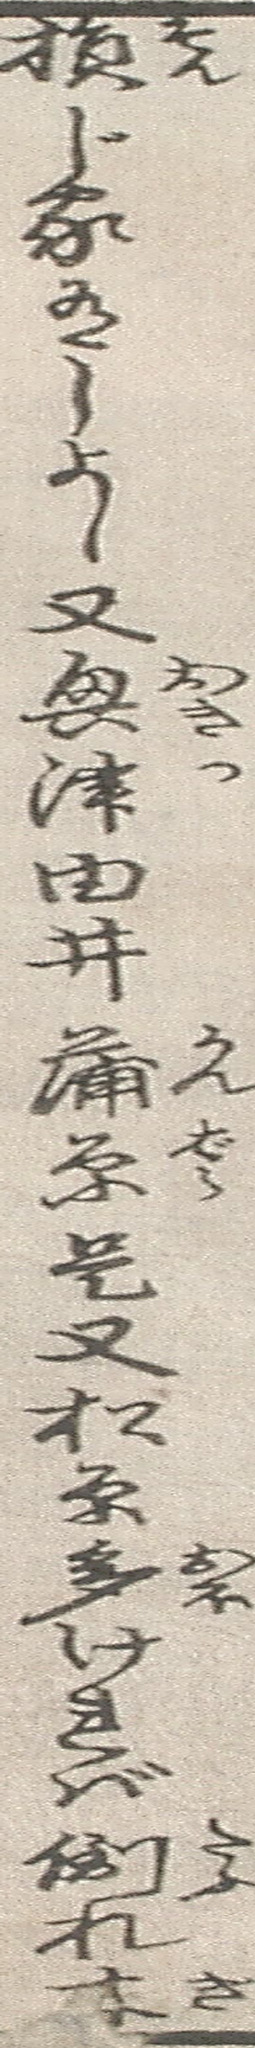損じ家有しよし又興津由井蒲原是又松原多けれバ倒れ木
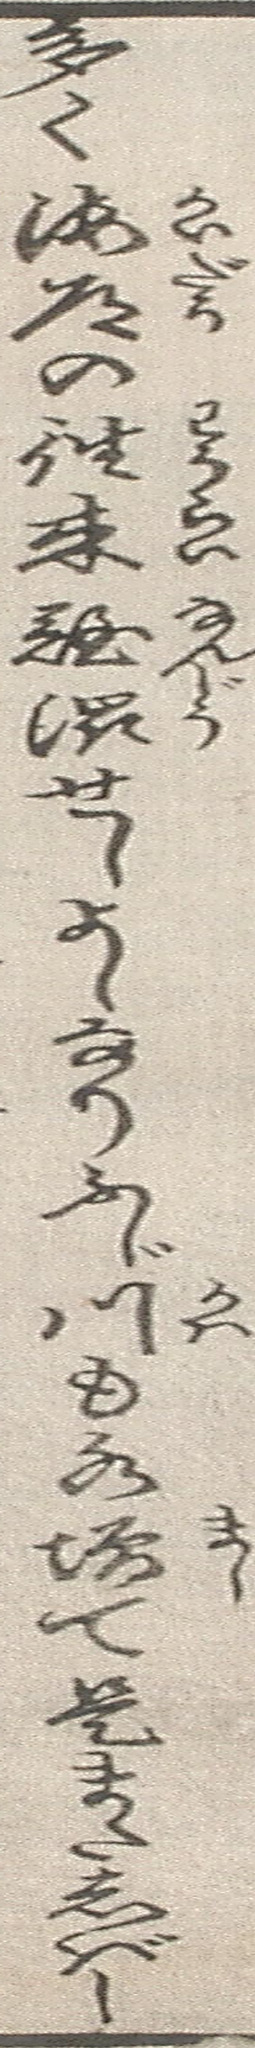多く海道の往来難渋せしよしなりふじ川も水増て是またしバし
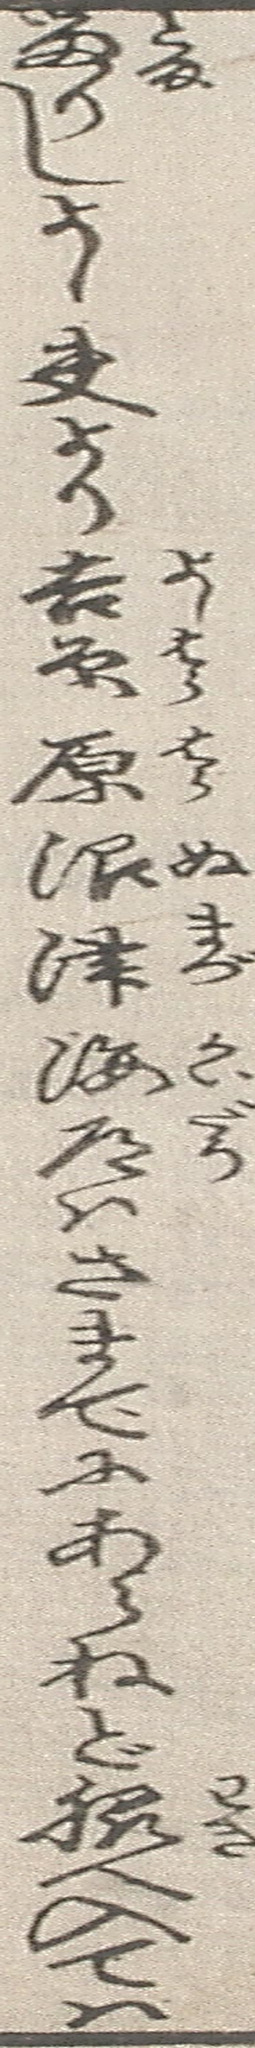留りしよし夫より吉原原沼津海道ハさまでにあらねど脇へ入てハ
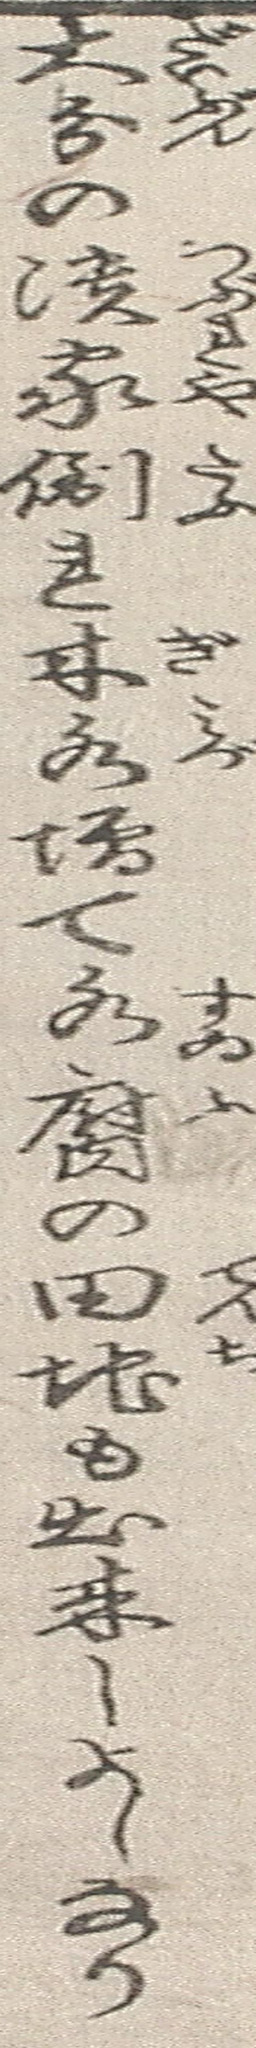大分の潰家倒れ木水増て水腐の田地も出来しよしなり
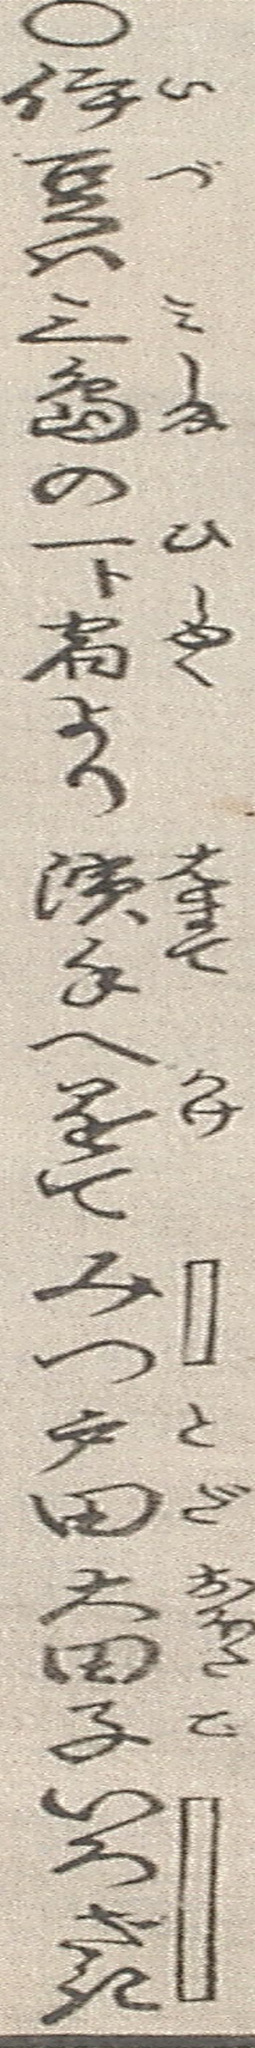◯伊豆ハ三嶋の一ト宿より濱手へ懸てみつ戸田大田子いろざき
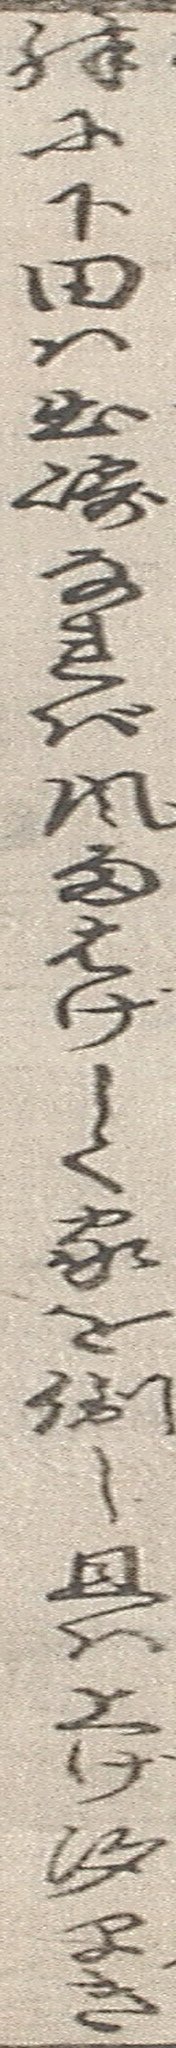殊に下田ハ出崎なれバ風雨はげしく家を倒し且ハ上げ汐早き
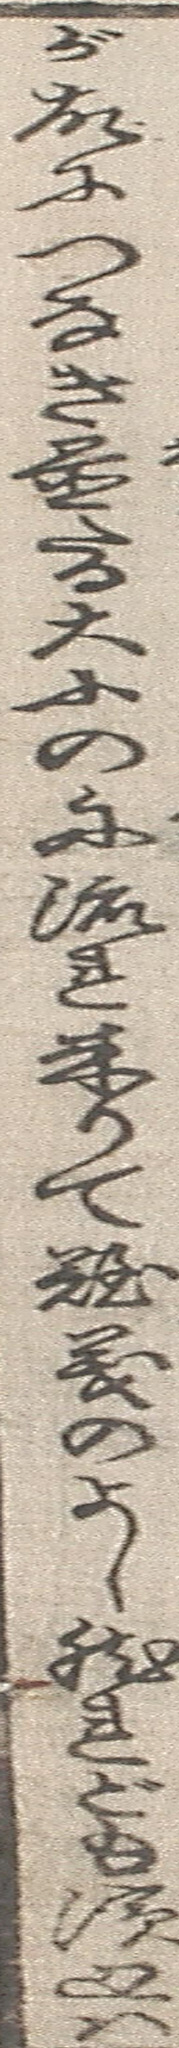が故につなき置たる大小の舟流れ来りて難義のよし然れども浜辺ハ
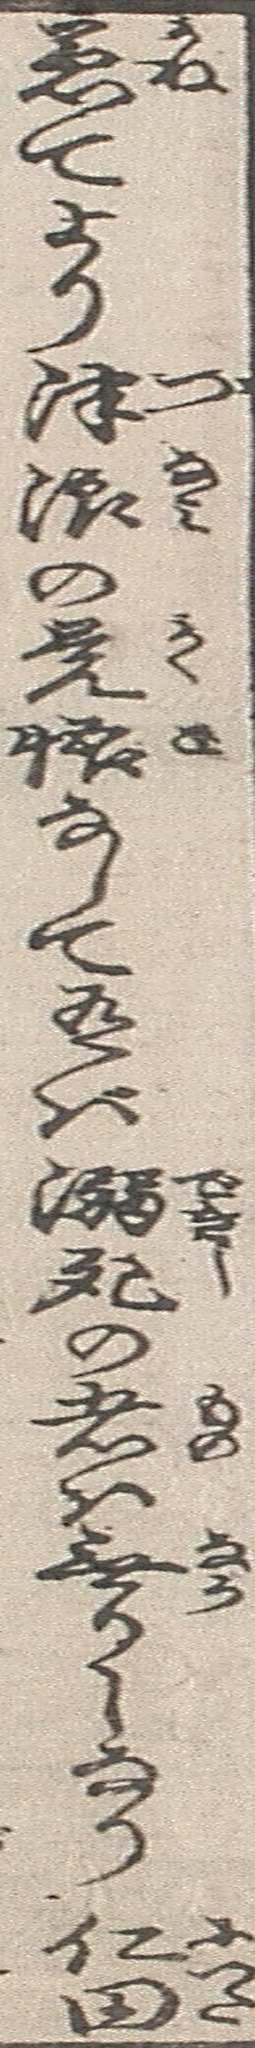兼てより津浪の覚悟なして有バ溺死の者ハ無りしなり仁田
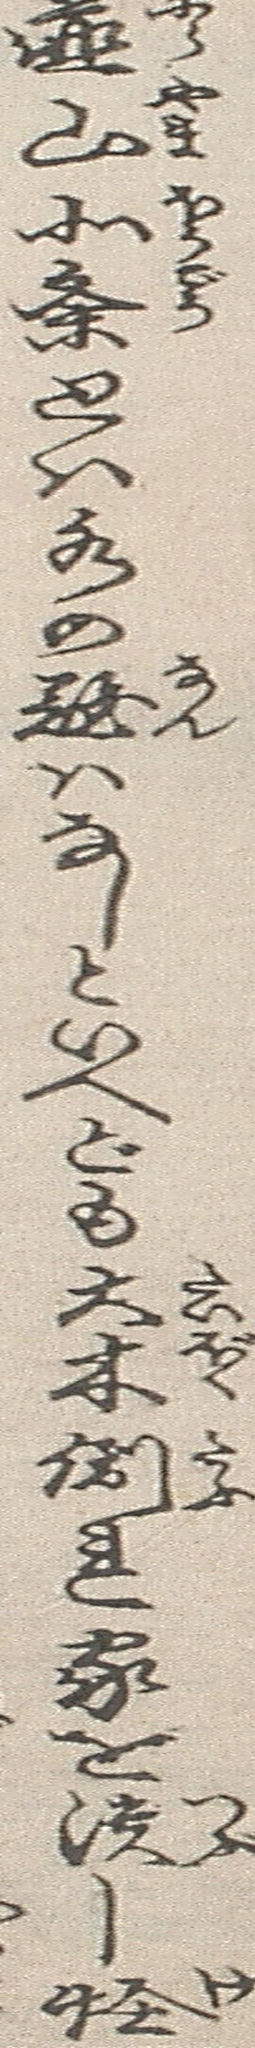韮山北条辺ハ水の難ハなしといへども大木倒れ家を潰し怪
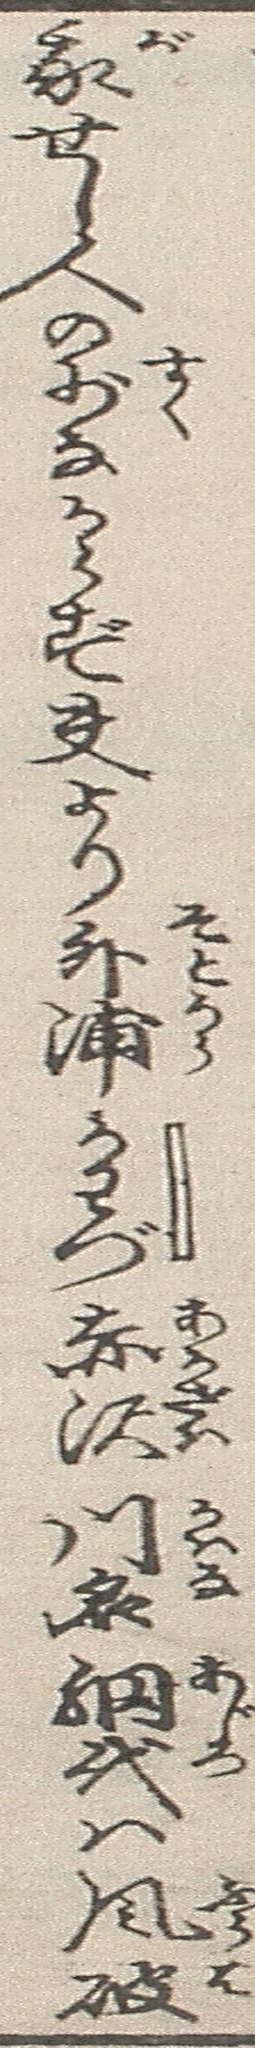我せし人の少なからず夫より外浦かわづ赤沢川名網代ハ風破
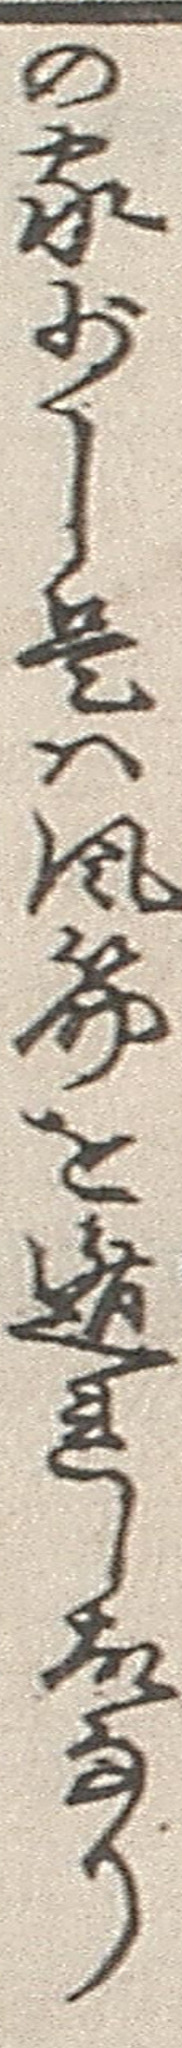の家少し是ハ風筋を遁れし故なり
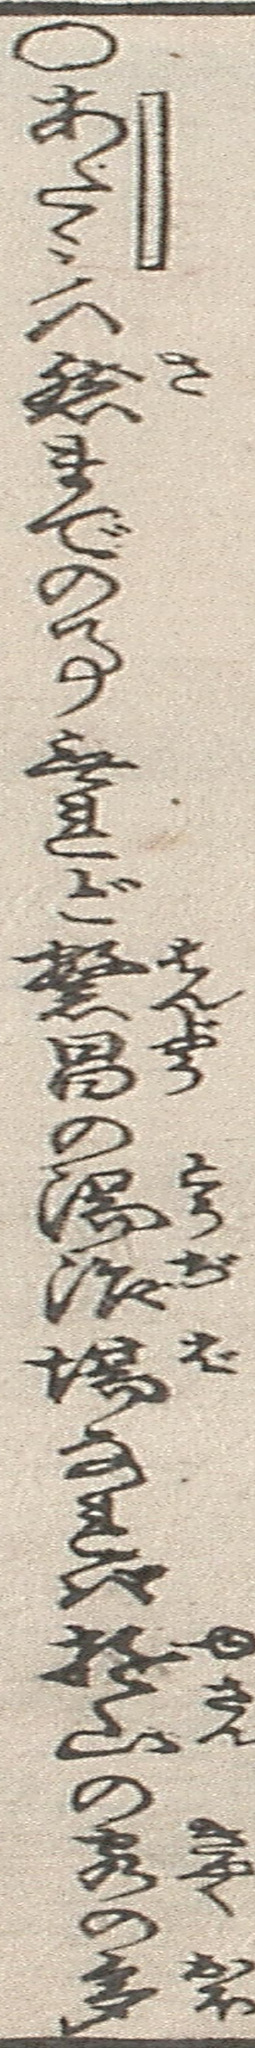◯あたミハ然までの事無れど繁昌の湯治場なれバ遊山の客の多
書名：安政風聞集　上中下　全
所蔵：東京大学地震研究所図書室 Earthquake Research Institute Library, The University of Tokyo, JAPAN
